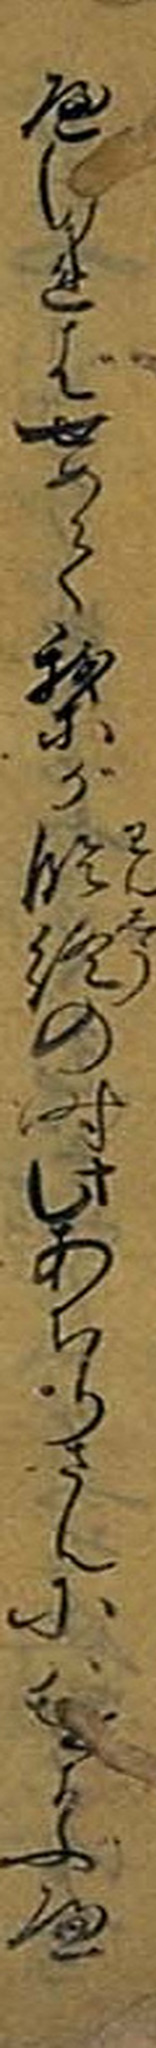へければせめて我等が臨終の時此あちりさんにはをよふへ
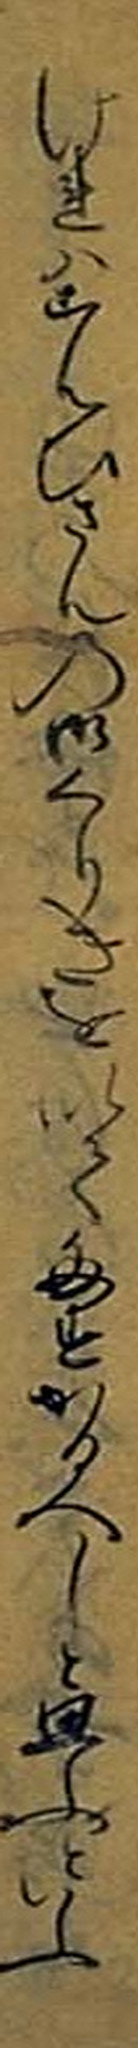けれはこんひさんの御くりきを以てたすかるへしと思ふといふ
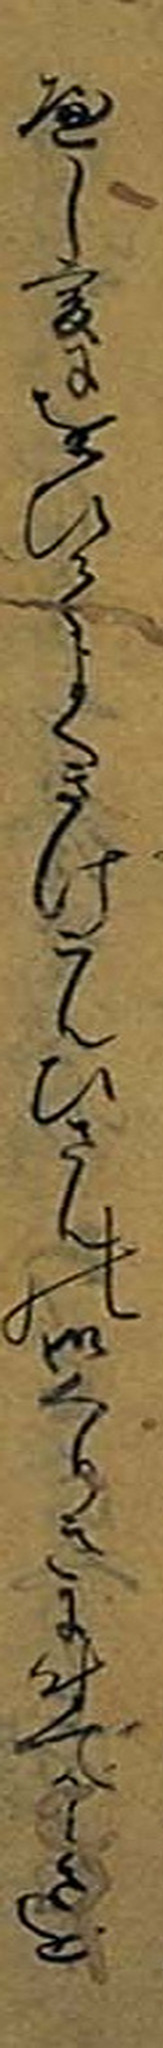へし爰にをひてよくきけこんひさんの御くりきに付てかしきを
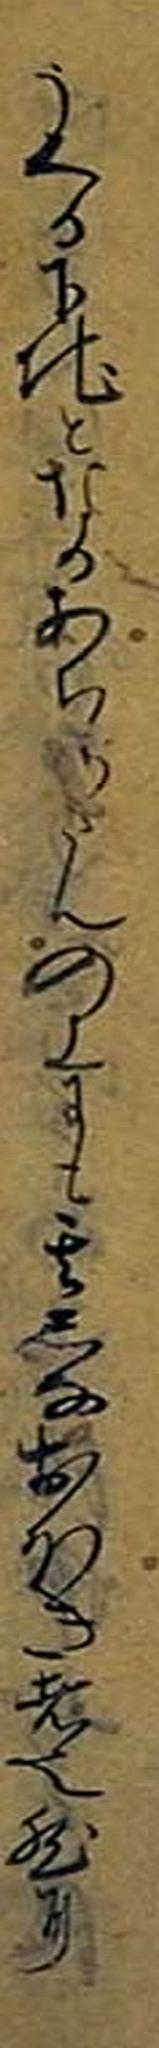うくる下地となるあちりさんの上にも其しなおほき者也然に
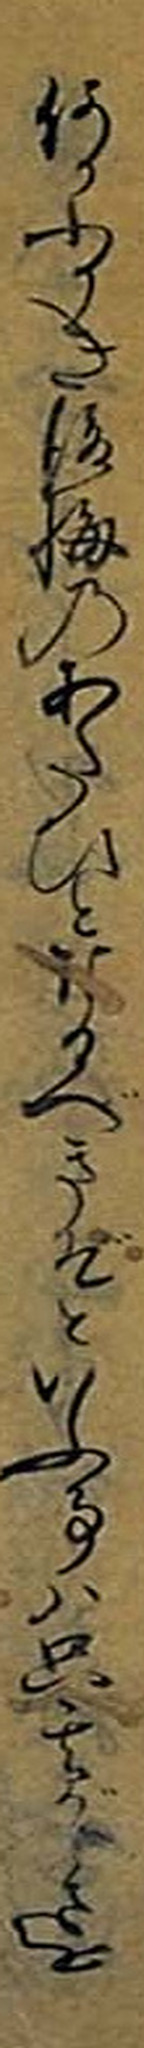何かふかき後悔のあたひとなるべきぞといふ事は只其がさを

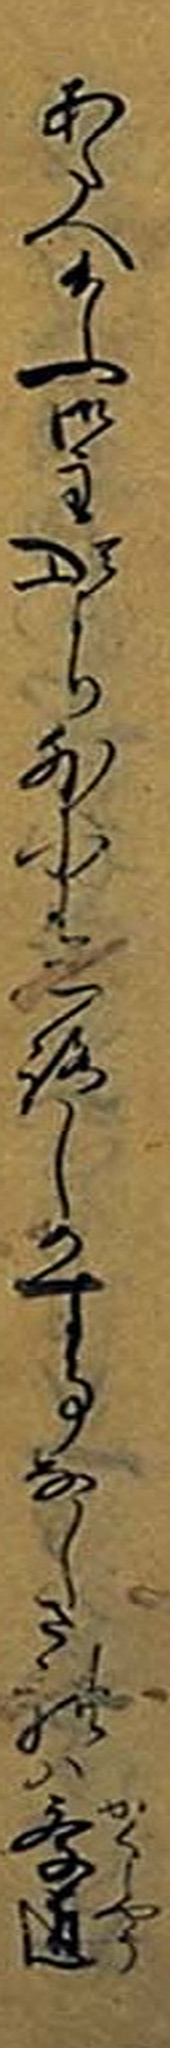あたへ給ふ御主Ⅾより外にろしめす事なしされは学匠
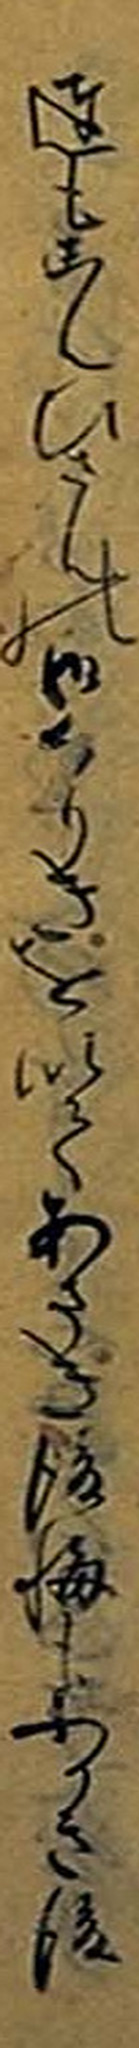達もこんひさんの御くりきを以てあさき後悔もふかき後
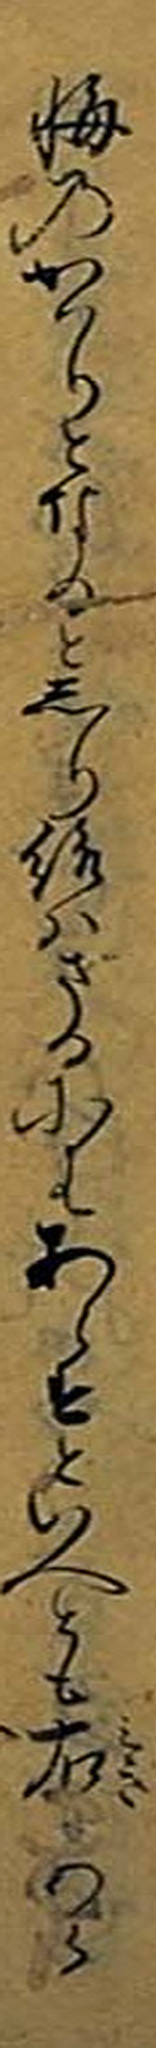悔のかはりとなるとしり給はざるにはあらすといへとも右ら
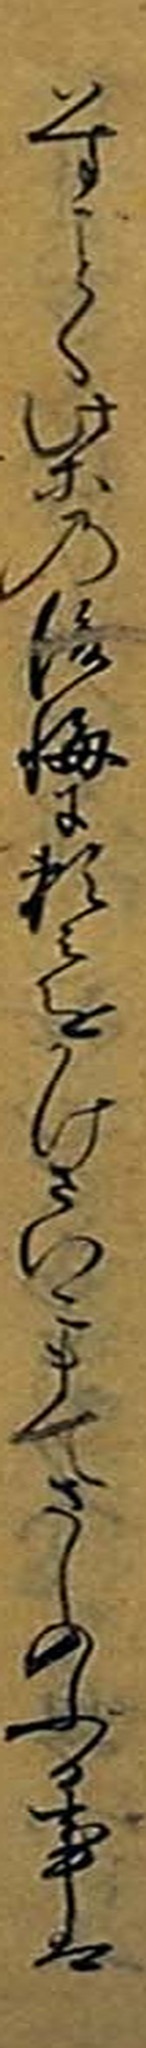はすごとく此等の後悔に頼みをかけさいこまてさしのぶる事は
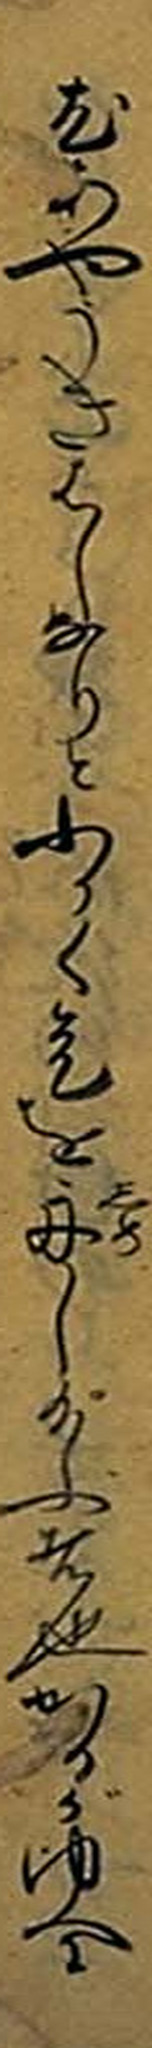尤あやうきはしなりとふかく是を示し給ふ者也かるがゆへに
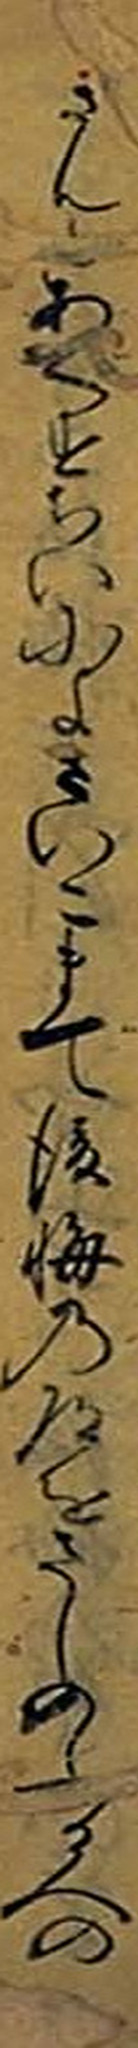きんあくすちいによさいこまで後悔の道をさしのる人の
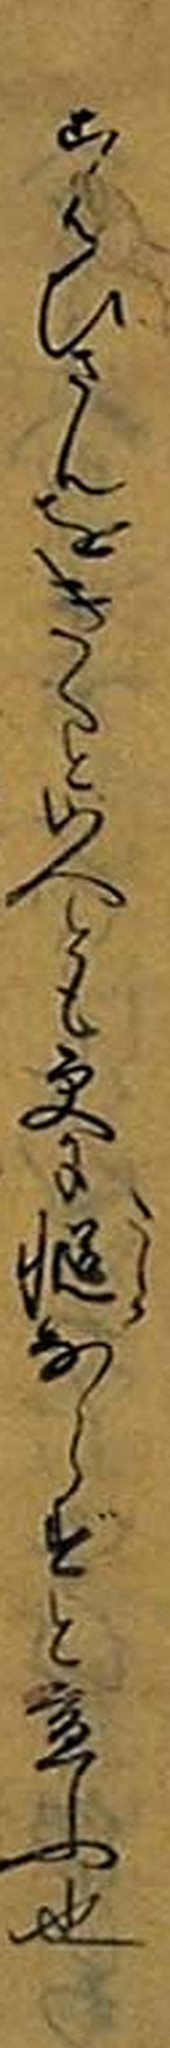こんひさんをきくといへとも更に慥ならずと宣ふ也
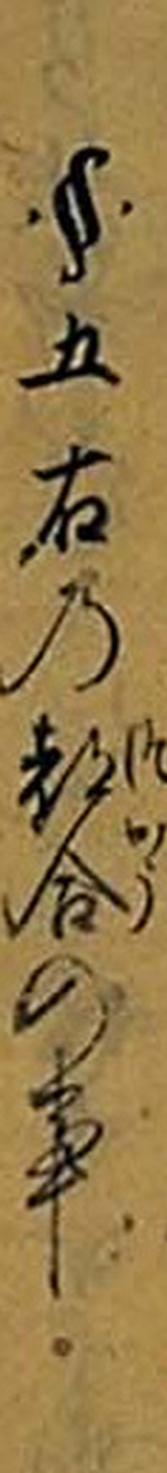§五右の都合の事
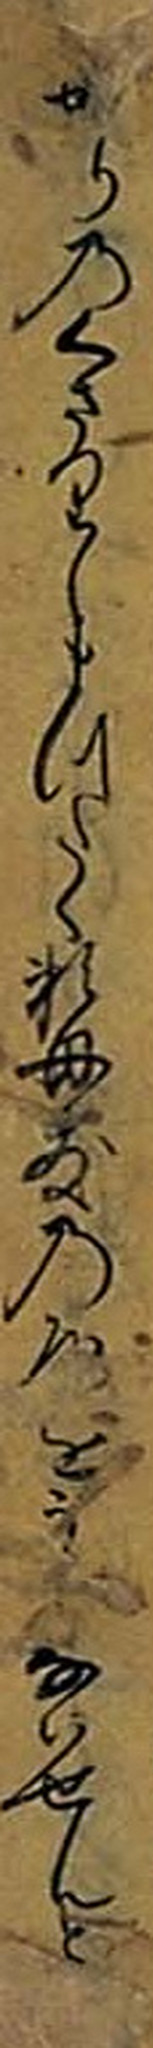かりのくさりしまつたく頼母敷の道をうなはせんと
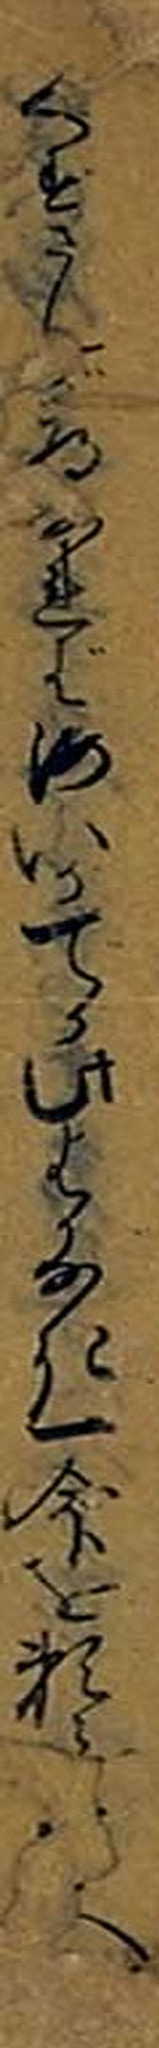くすさんが為なれば汝いかで此はかなき一命を頼み
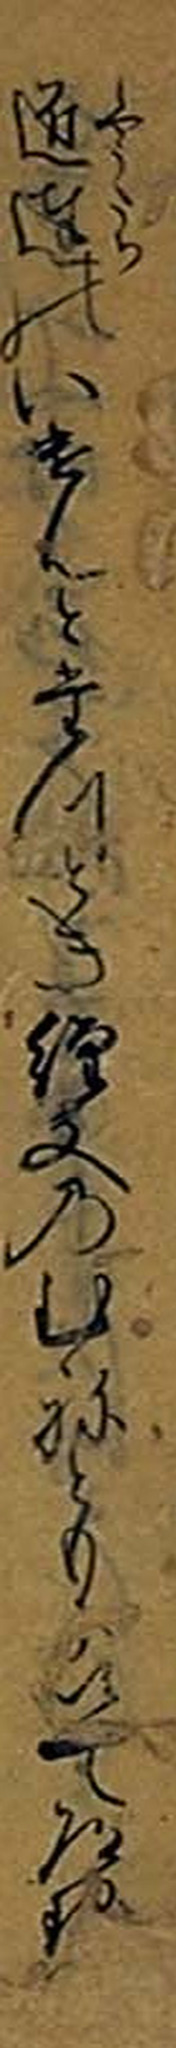匠達のいけんとたつとき経文のむねとも以て道
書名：ぎやどぺかどる
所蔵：東京大学総合図書館 / General Library in the University of Tokyo
